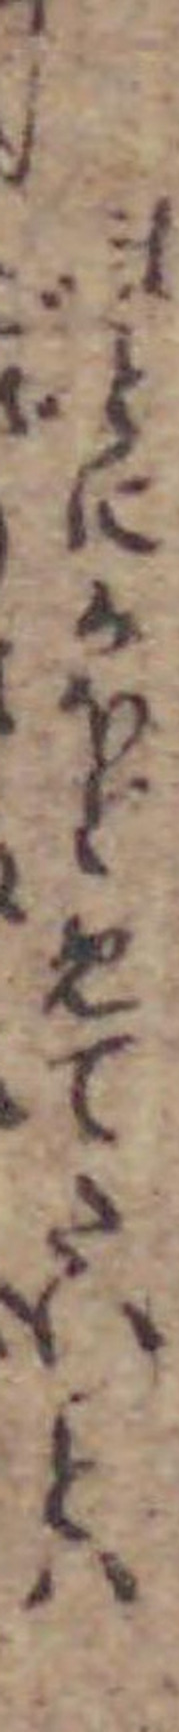まことにかほどめてたいことは
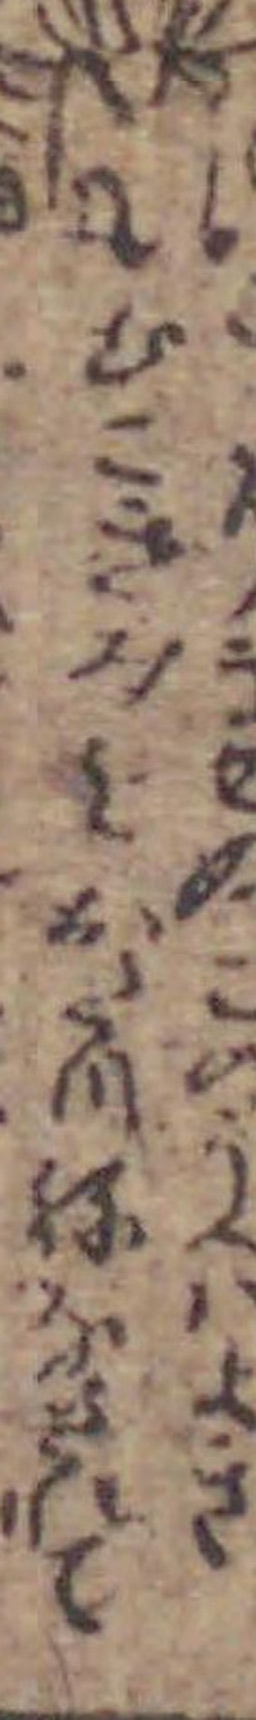むこきみをおたつねなされて
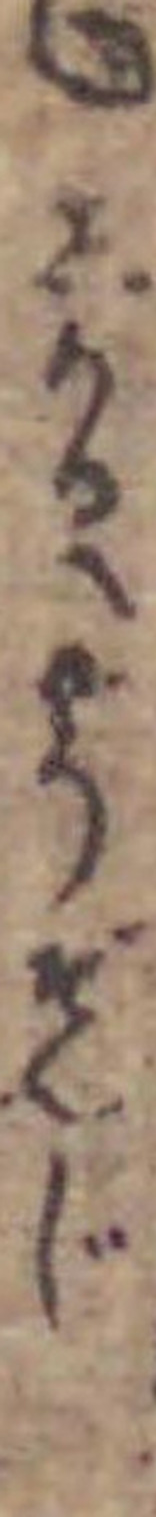しかるへやうぞんじ
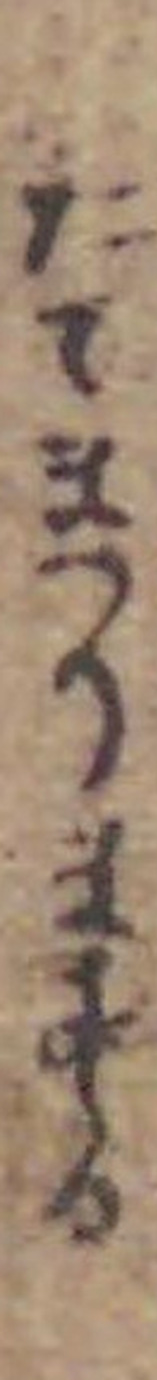たてまつりまする
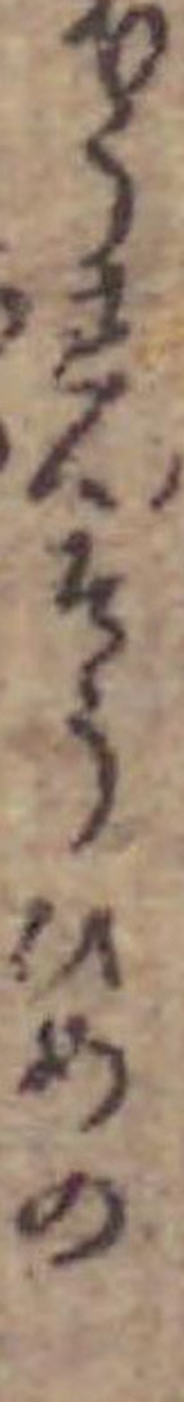ほうれんそうひめの
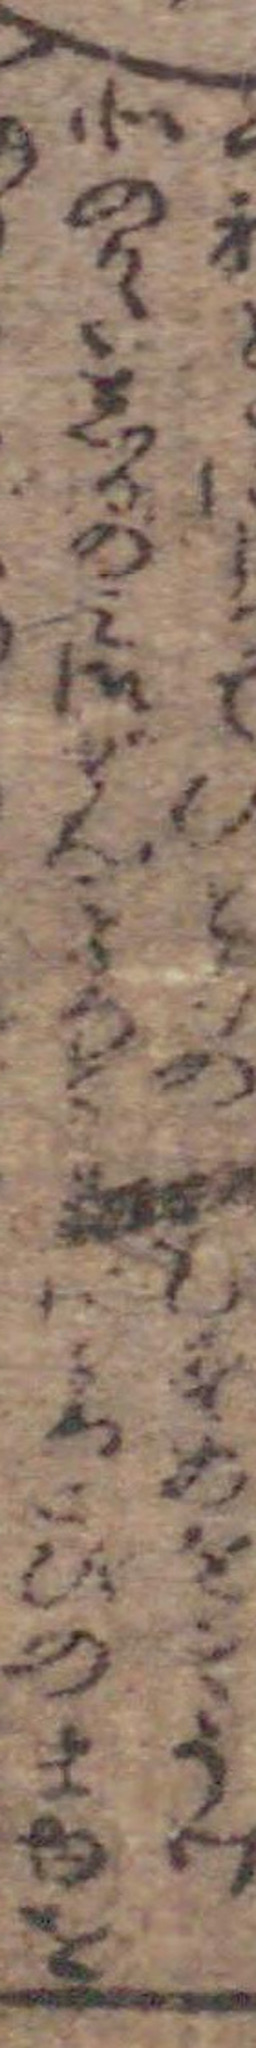北のかたしるのみ御ぜんもろともによろこひのまゆを
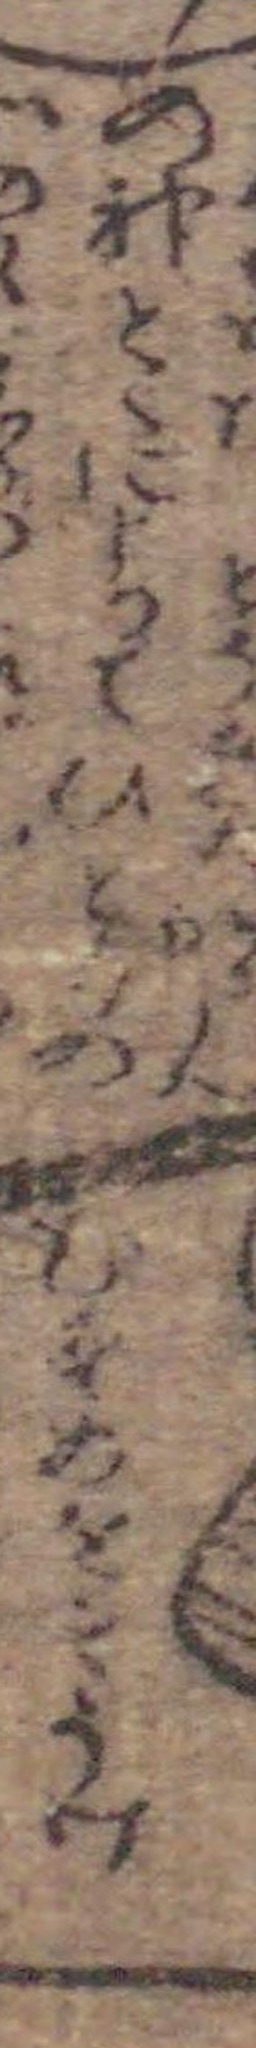の神とくによつてひとりのむすめをもうけ
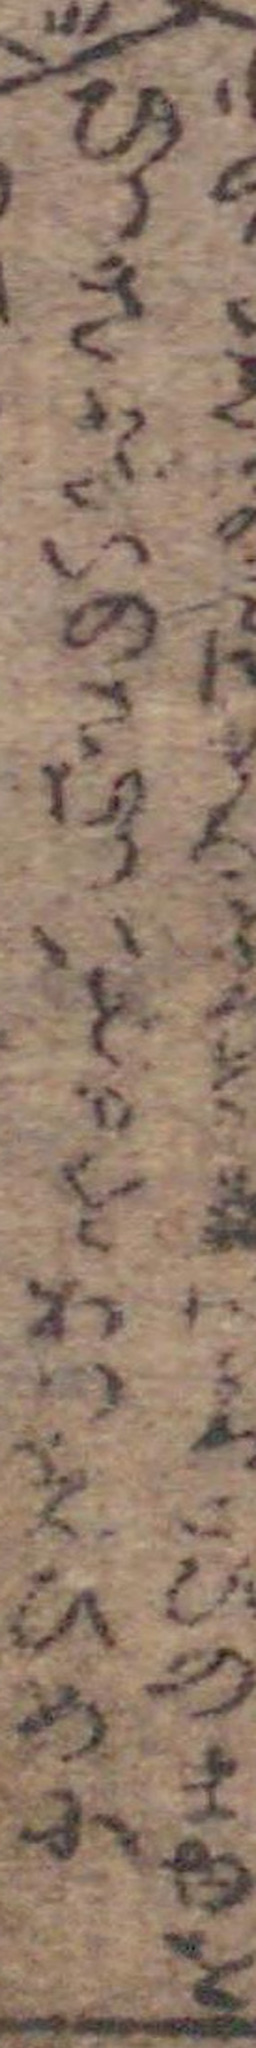ひらきふだいのさむらいどもをあつめひめに
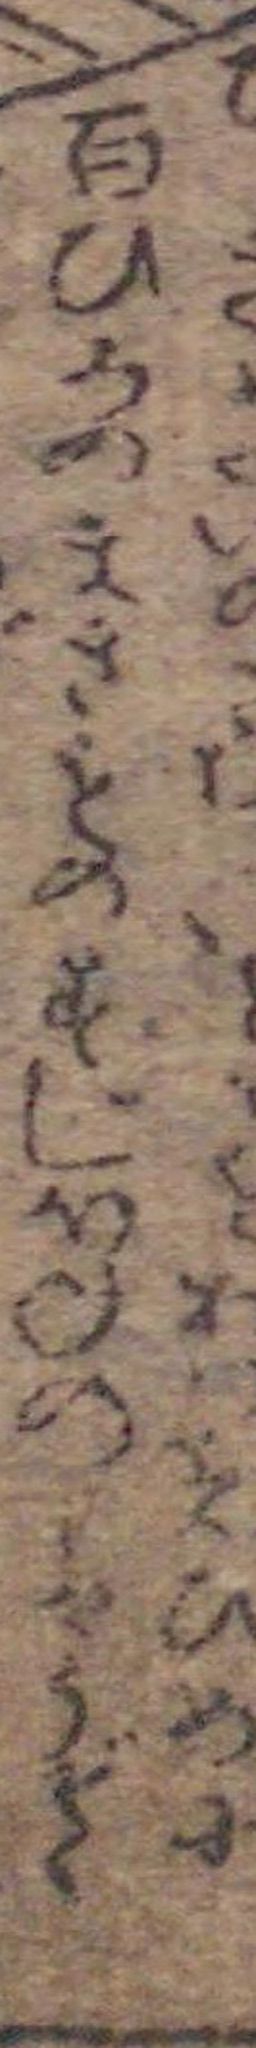百ひろのまきものすじほねのしやうぞく
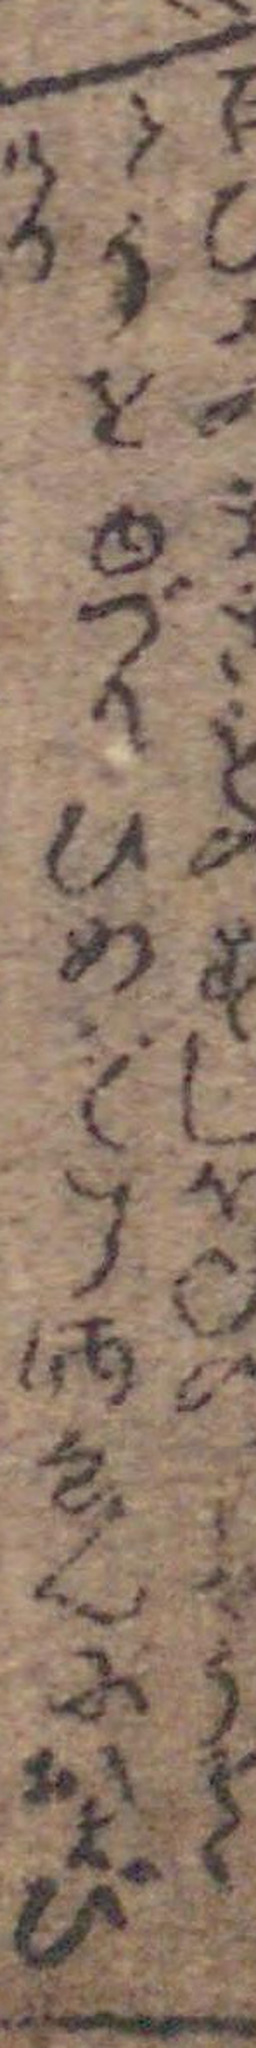とうをゆづりひめもす酒ゑんにおよび
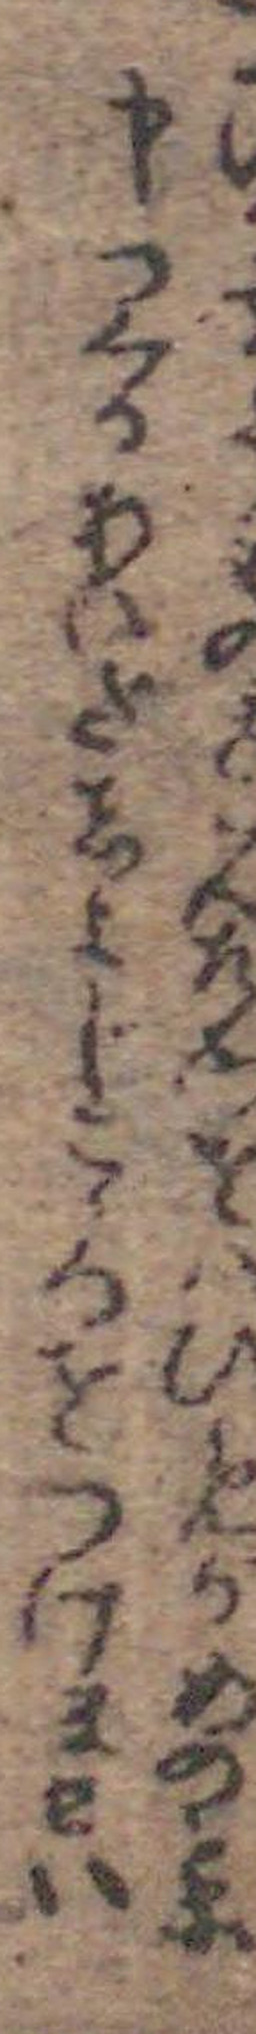申つくるあいだしよじこゝろをつけませい

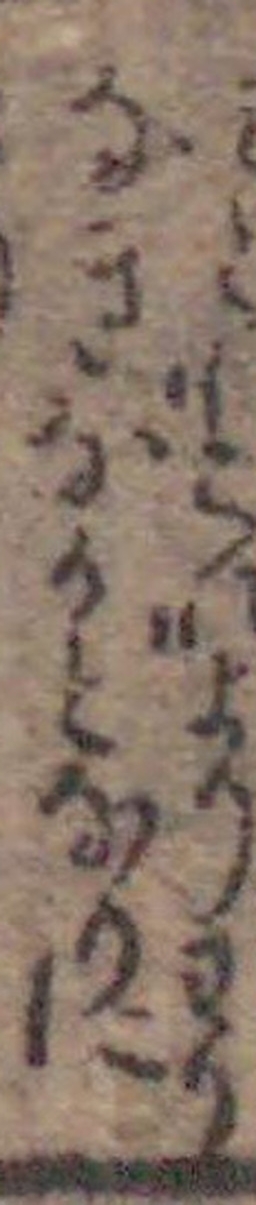なきなかとなりに
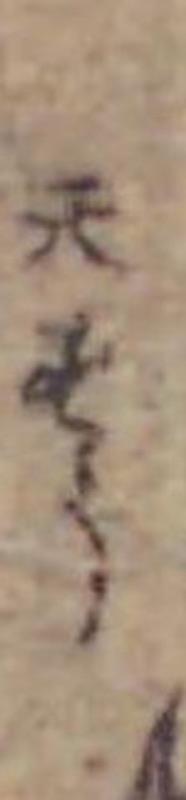天すう
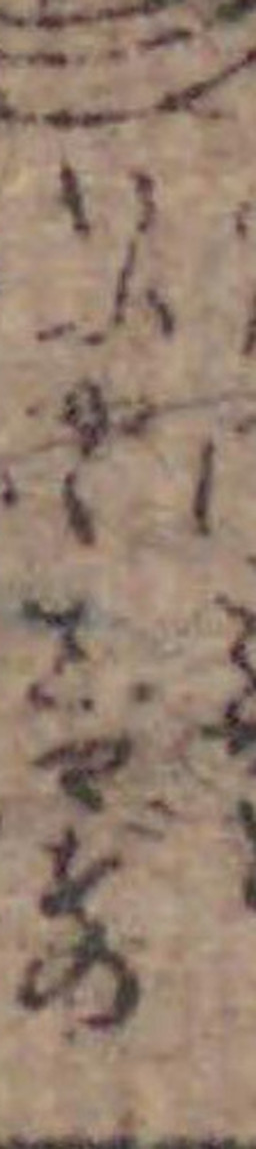いふやくしやだの
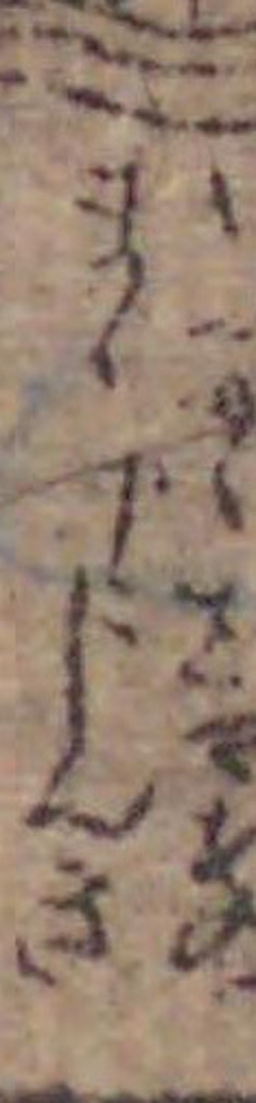まゝにんき
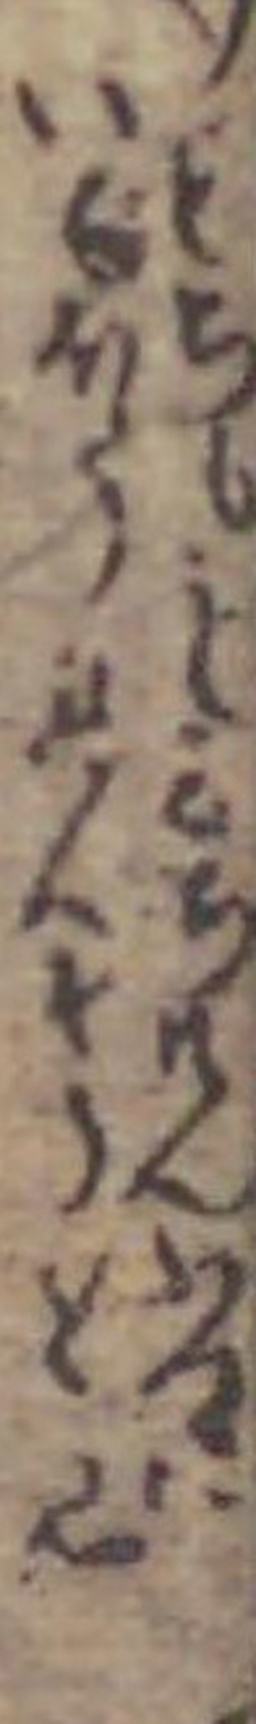いでほうれんそうを見
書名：腹京師食物合戦 : 2巻
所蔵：国立国会図書館 National Diet Library, JAPAN
